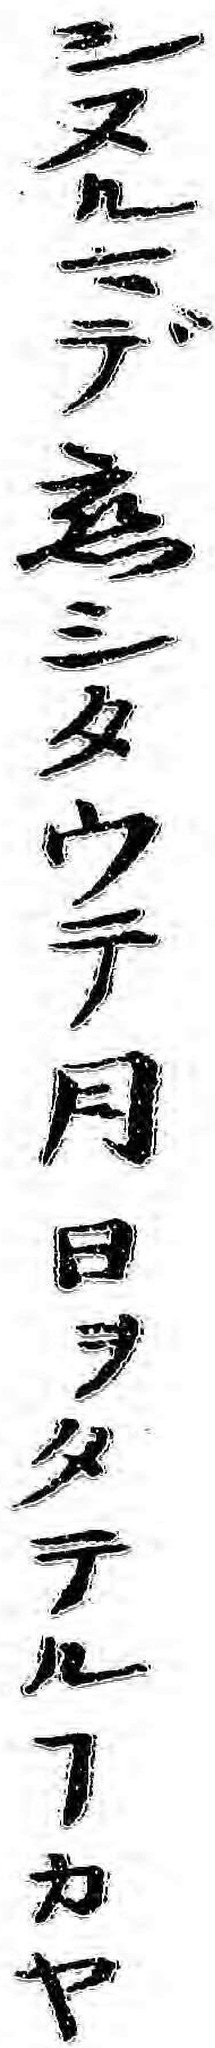シヌルマデ恋シタウテ月日ヲタテルコトカヤ
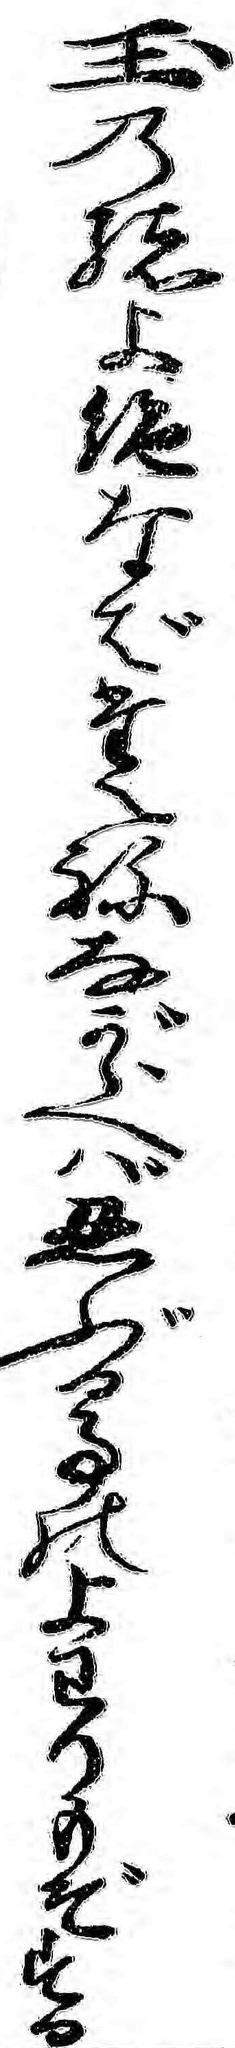玉の緒よ絶なばたえねながらへば忍ぶる事のよわりもぞする
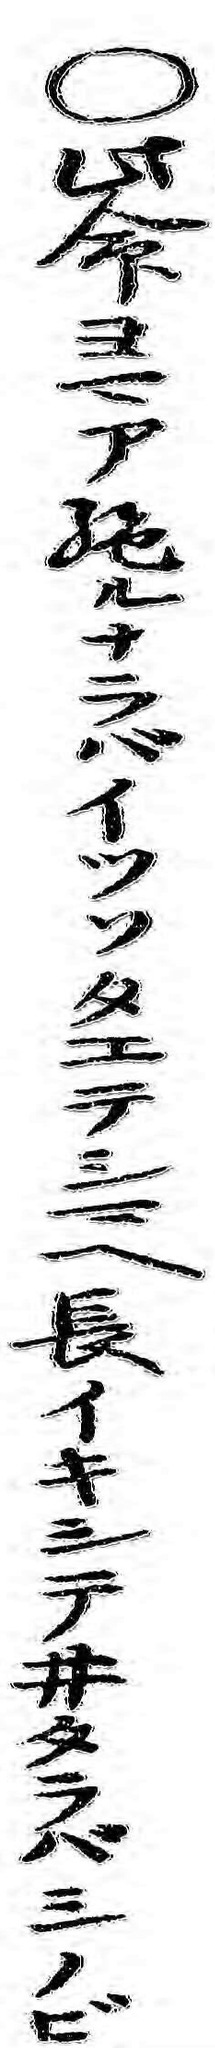◯此命ヨマア絶ルナラバイツソタエテシマヘ長イキシテヰタラバシノビ
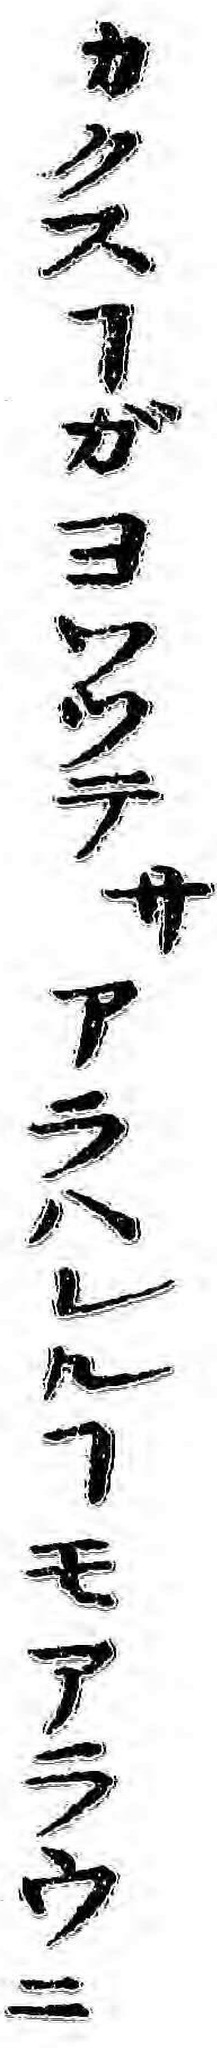カクスコトガヨワツテサアラハレルコトモアラウニ
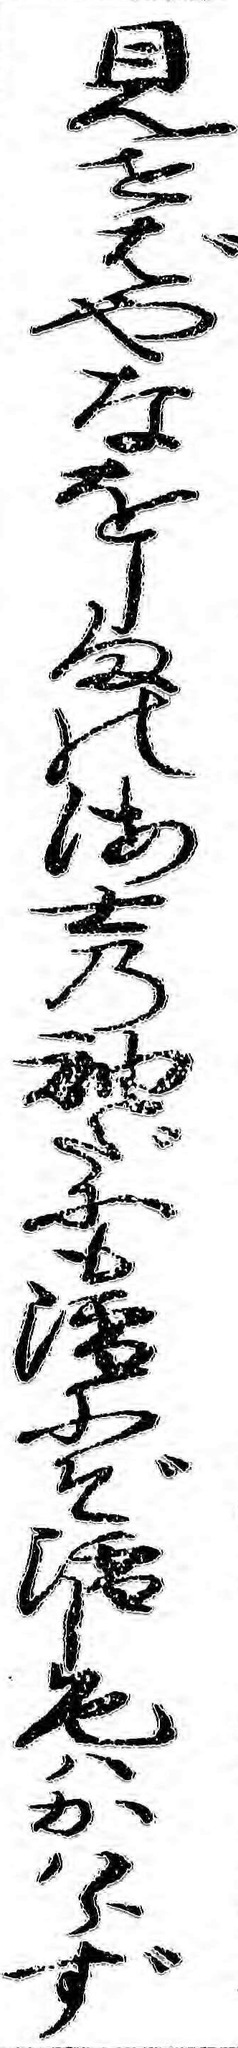見せばやなをじまの海士の袖だにも濡にぞ濡し色はかはらず
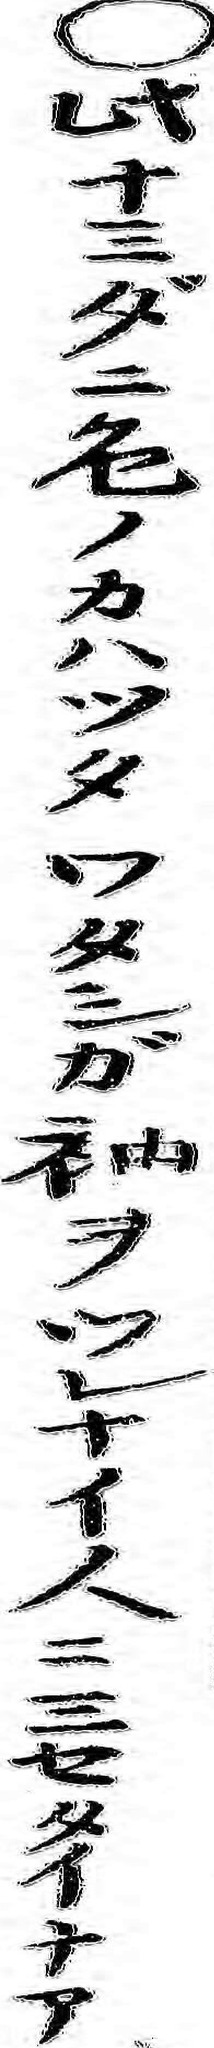◯此ナミダニ色ノカハツタワタシガ袖ヲツレナイ人ニミセタイナア
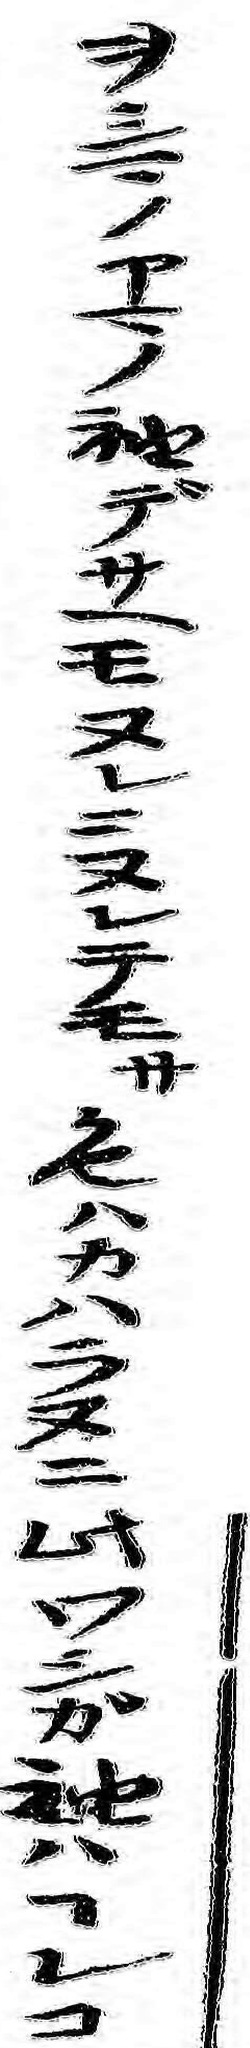ヲシマノアマノ袖デサヘモヌレニヌレテモサ色ハカハラヌニ此ワシガ袖ハコレコ
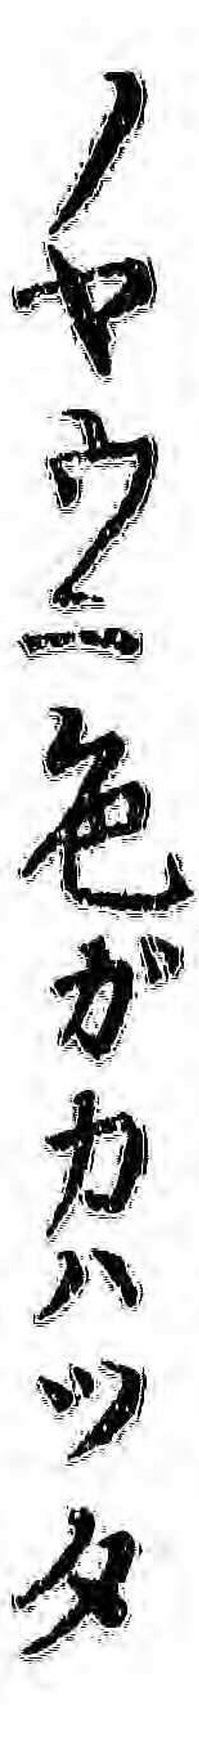ノヤウニ色ガカハツタ
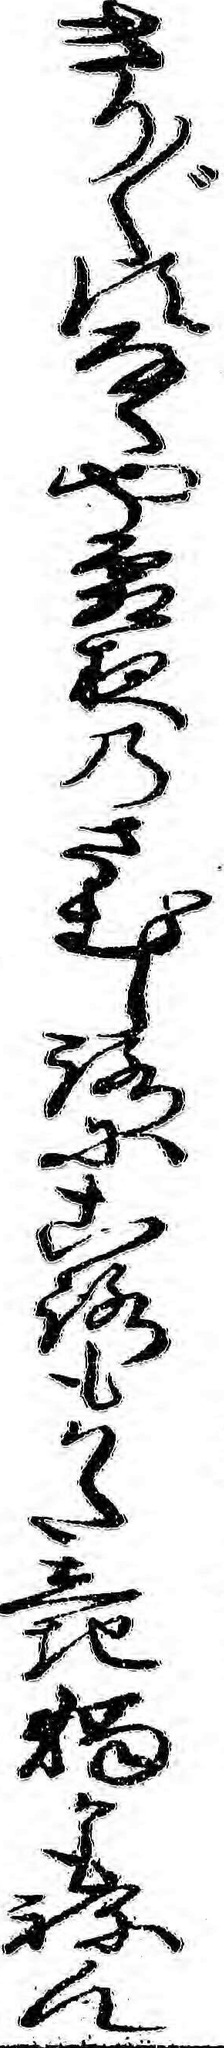きり〴〵すなくや霜夜のさむしろにころもかたしき独かもねむ
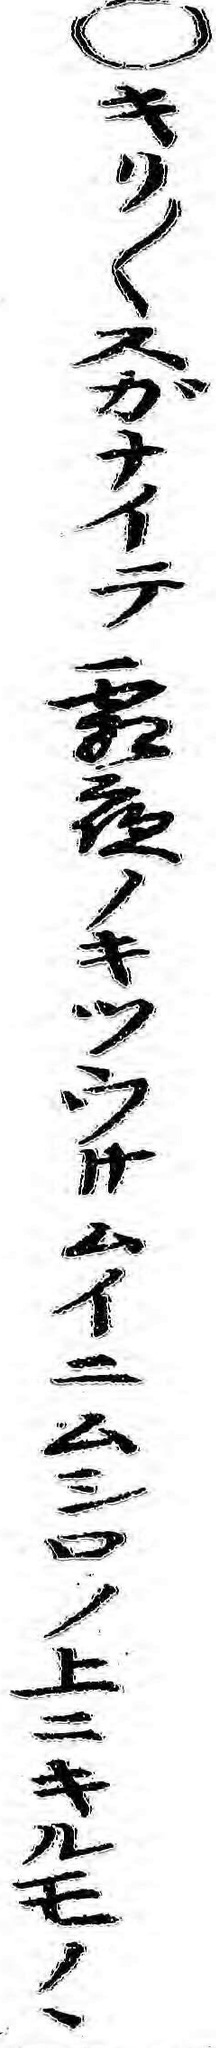◯キリ〳〵スガナイテ霜夜ノキツウサムイニムシロノ上ニキルモノヽ
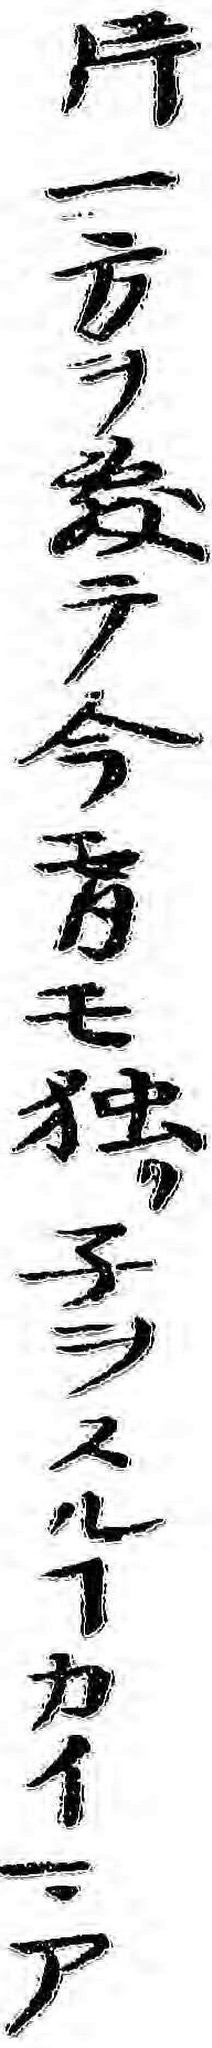片一方ヲ敷テ今宵モ独リネヲスルコトカイマア
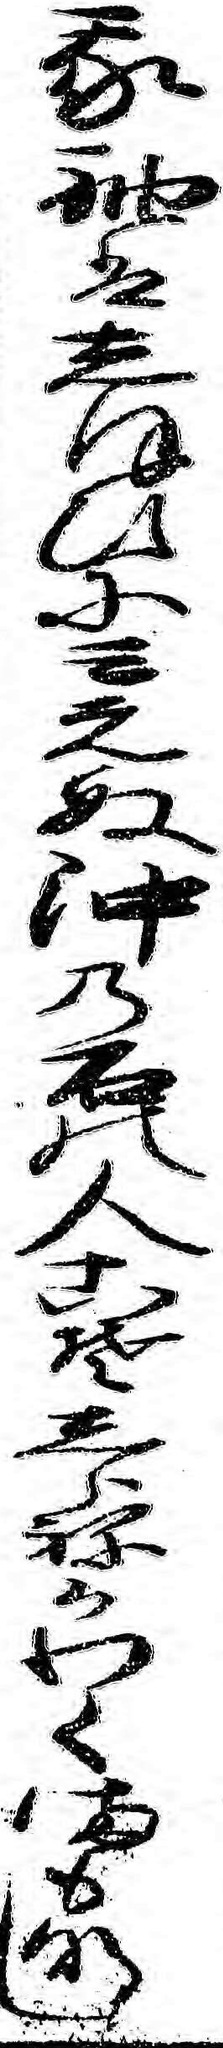我袖はしほひにみえぬ沖の石の人こそしらねかわくまもなし
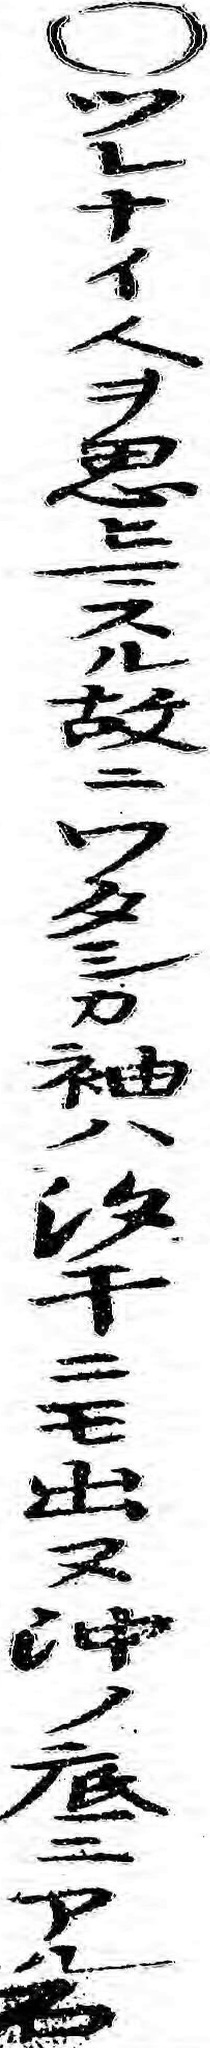◯ツレナイ人ヲ思ヒマスル故ワタシカ袖ハ汐干ニモ出ヌ沖ノ底ニアル石

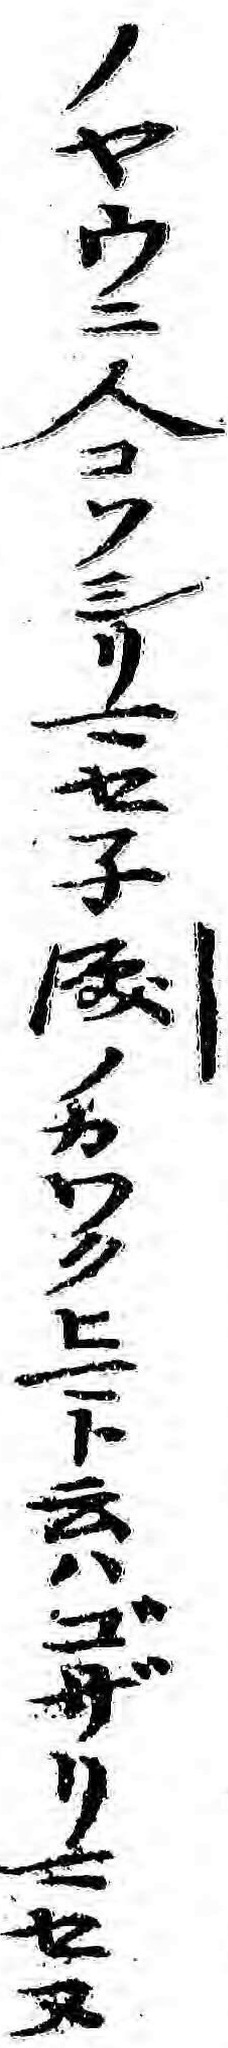ノヤウニ人コソシリマセネ涙ノカワクヒマト云ハゴザリマセヌ
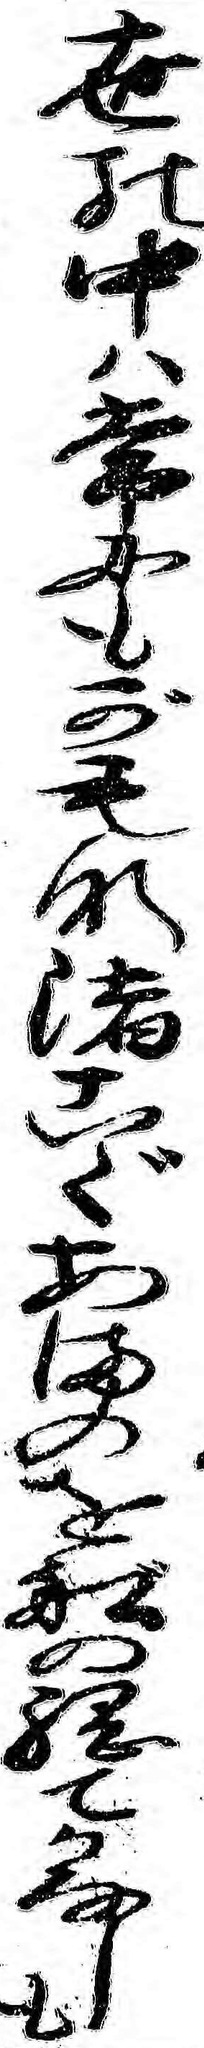世の中は常にもがもな渚こぐあまのを船の綱てかなしも
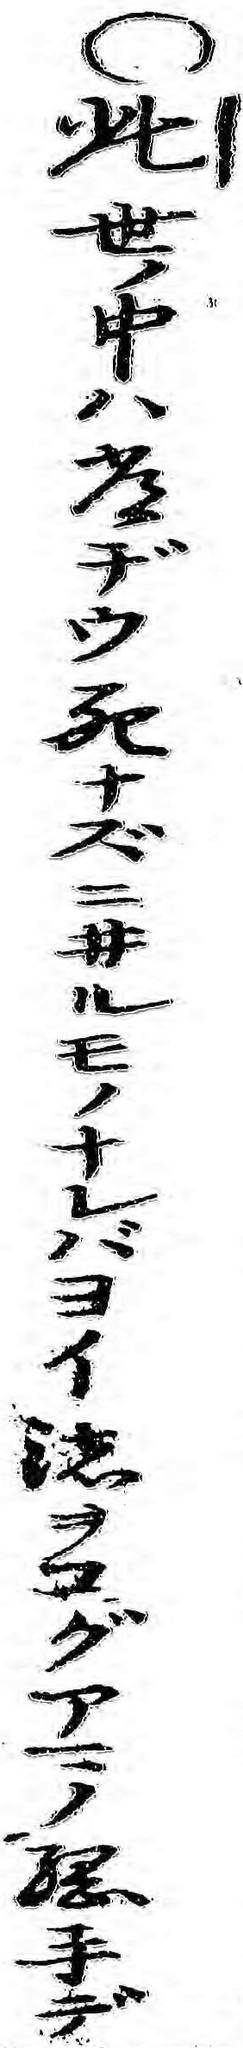◯此世ノ中ハ常ヂウ死ナズニヰルモノナレバヨイ渚ヲコグアマノ綱手デ
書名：百人一首／小倉の山ふみ
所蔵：国文学研究資料館
